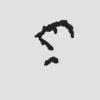月
